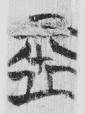亞
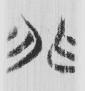非
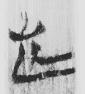{屮亡}
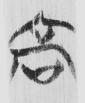高
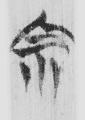宗
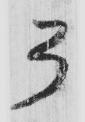乃
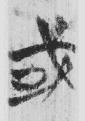或
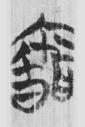{尒䎽}
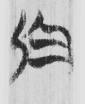於
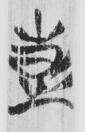彭
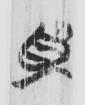且
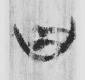曰
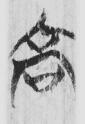高
